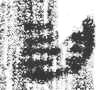周
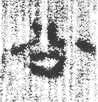公
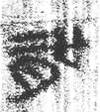脖（勃）
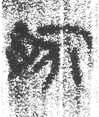肰（然）
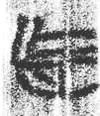迮（作）
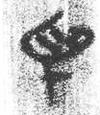色
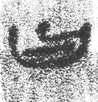曰
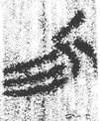易（狄）
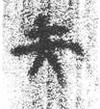夫
